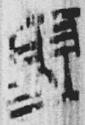坪（平）
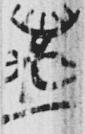○（萬）
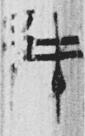邦
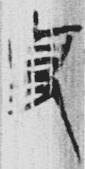史（使）
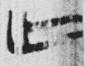亡（無）
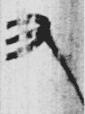又（有）
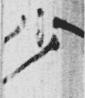少（小）
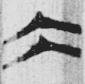大
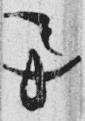{巴心}
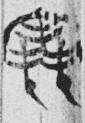○（脆）
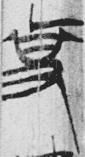史（使）
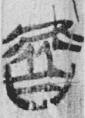{虍皆}（皆）
